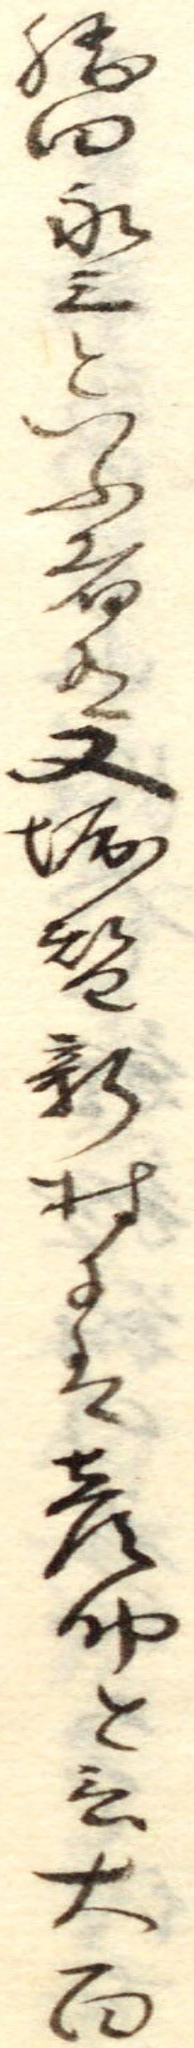勝田永三といふ者有又堀替新村には彦助と云大百
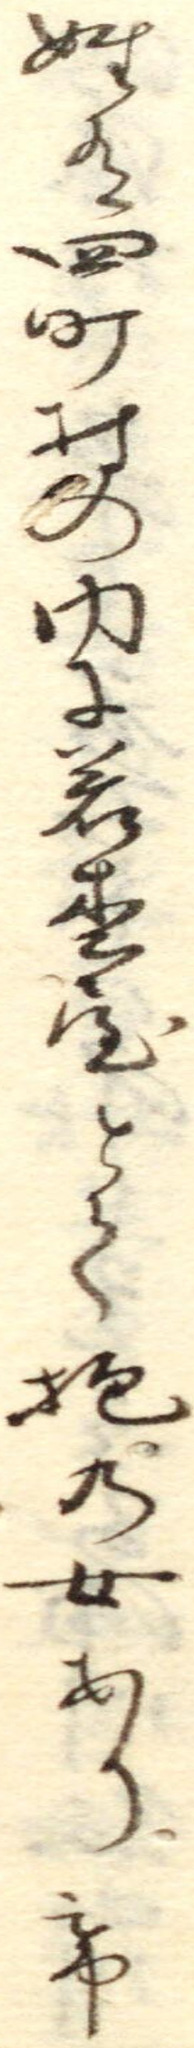姓有四町村の内に若枩屋とて抱の女ありけ
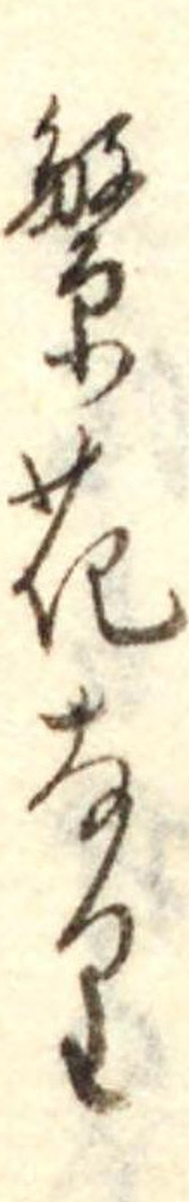繁花なり
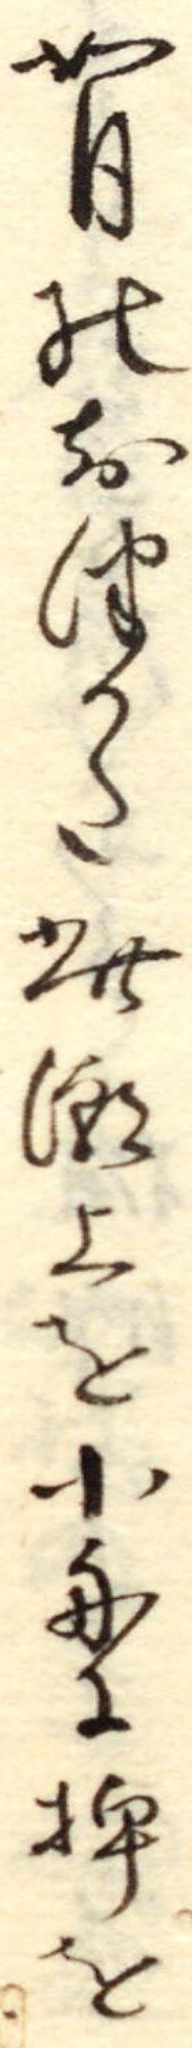如月の前つかた此潮上を小舟に棹を
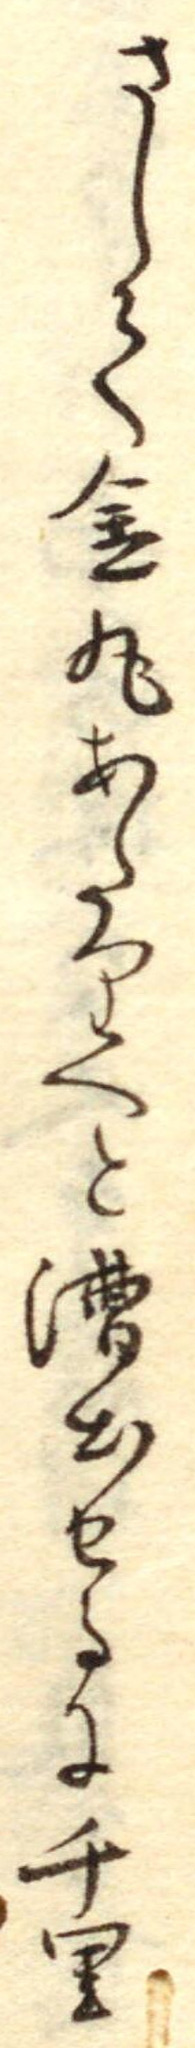さして金丸あたりへと漕出せるに千里
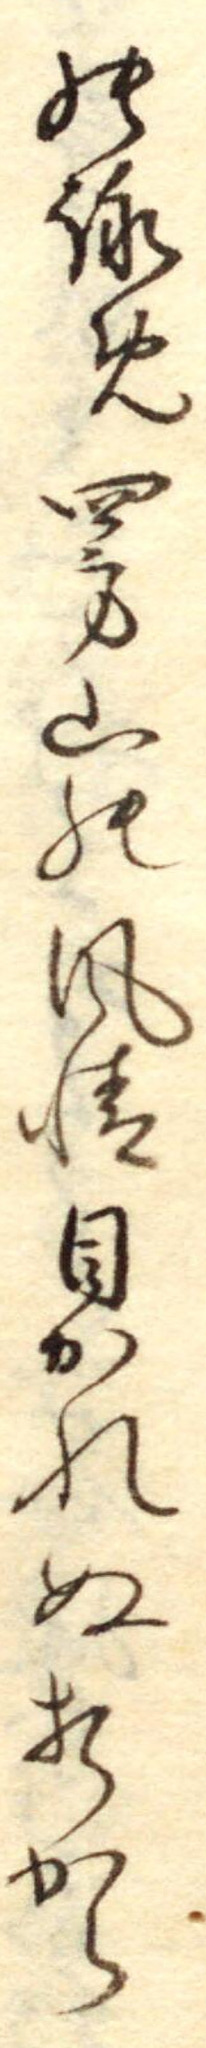の詠め四方山の風情目かれぬ折から
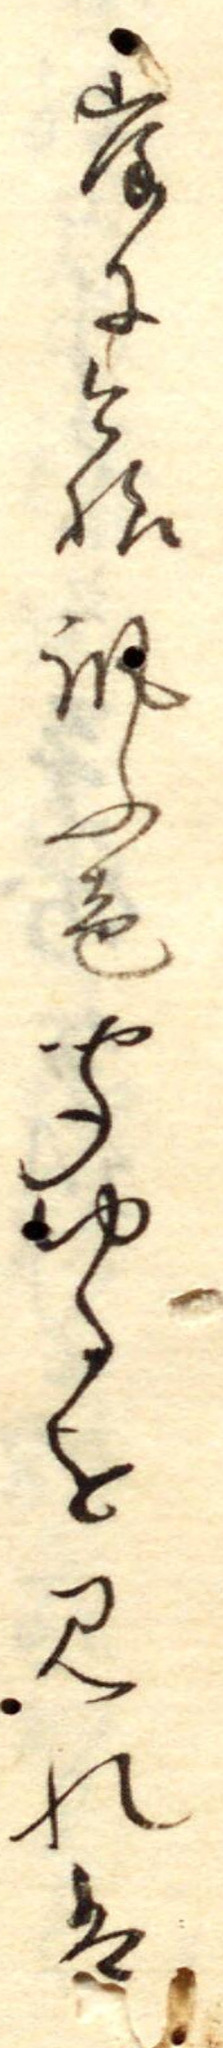岸に今様諷ふ色聞ゆくを見れは
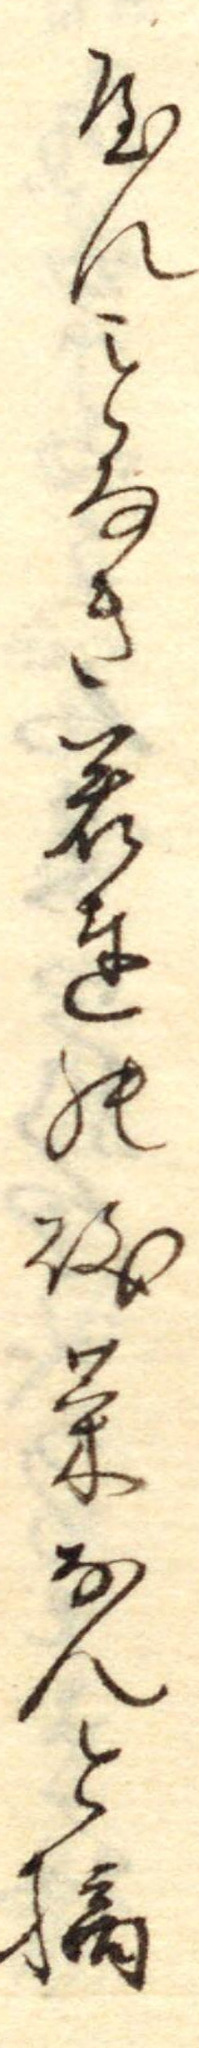やんことなき若達の礒菜なんと摘
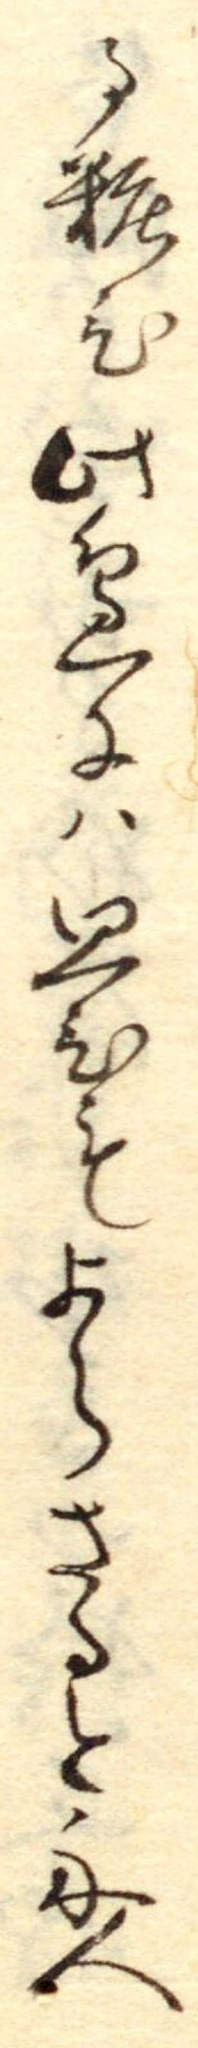る粧ひ此辺には思ひもよらさると舟人
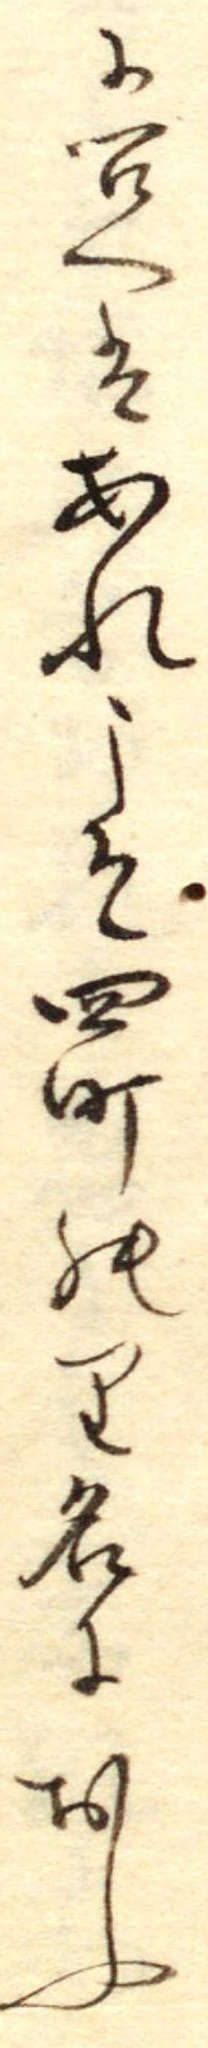に問へはあれこそ四町の里名におふ
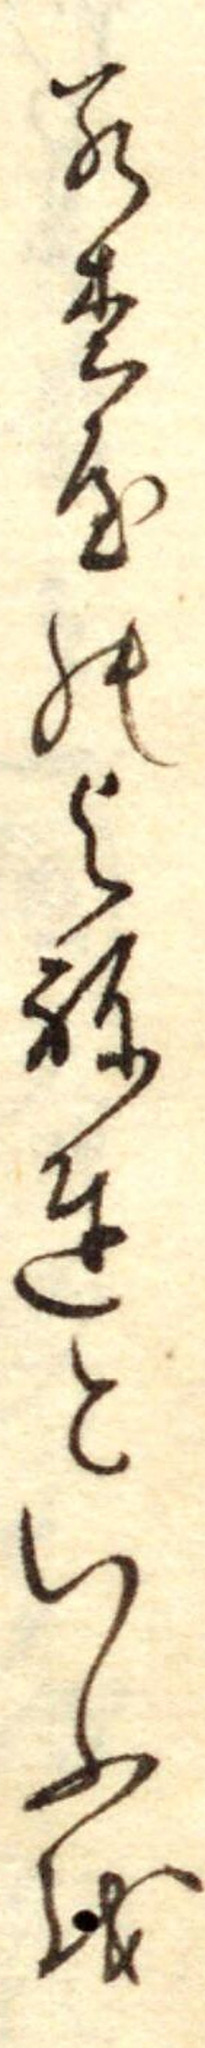若枩屋の与祢達といふを
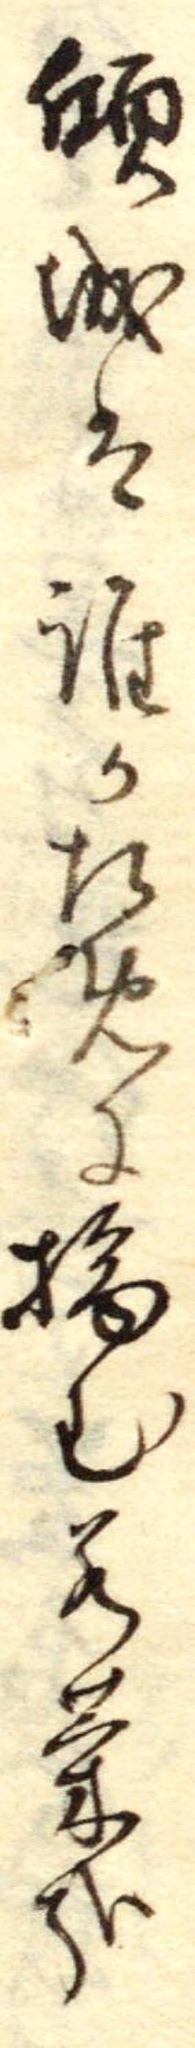傾城は誰かために摘む若菜哉
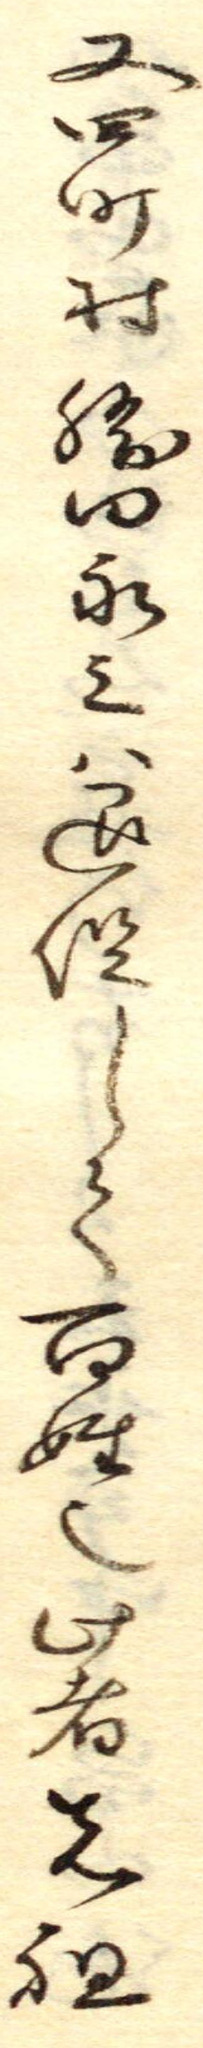又四町村勝田永三は退役して百姓也此者先祖

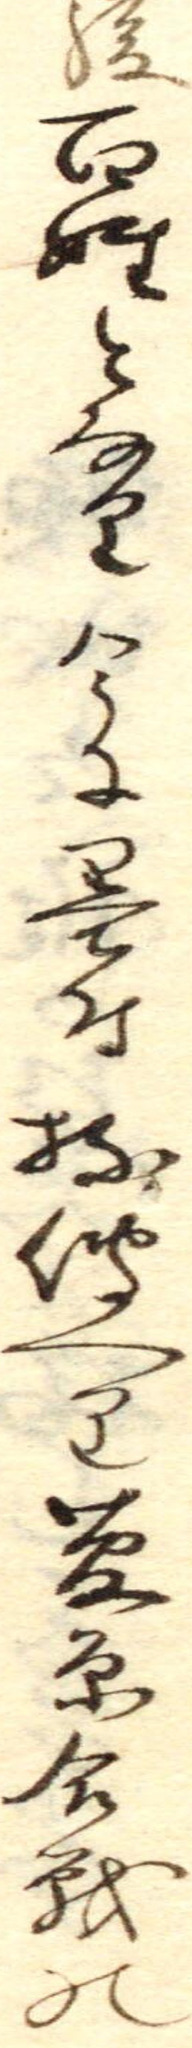し後百姓となり今に墨付持伝へり菅原合戦の
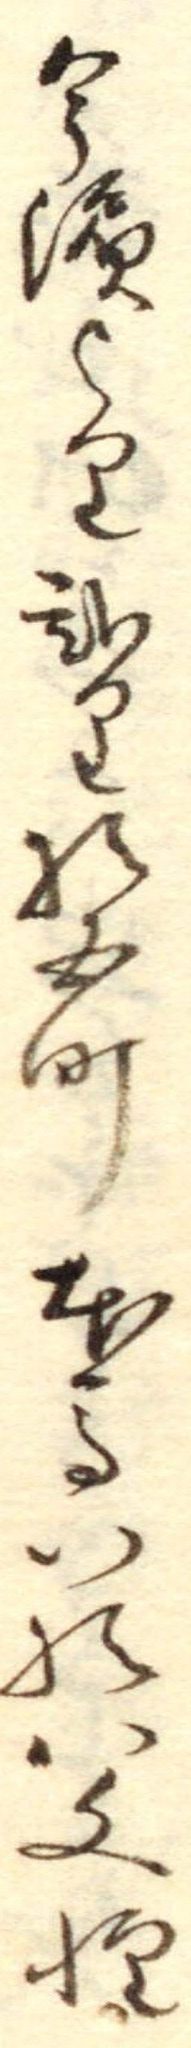今濱より弐里拾五町本馬八拾八文軽
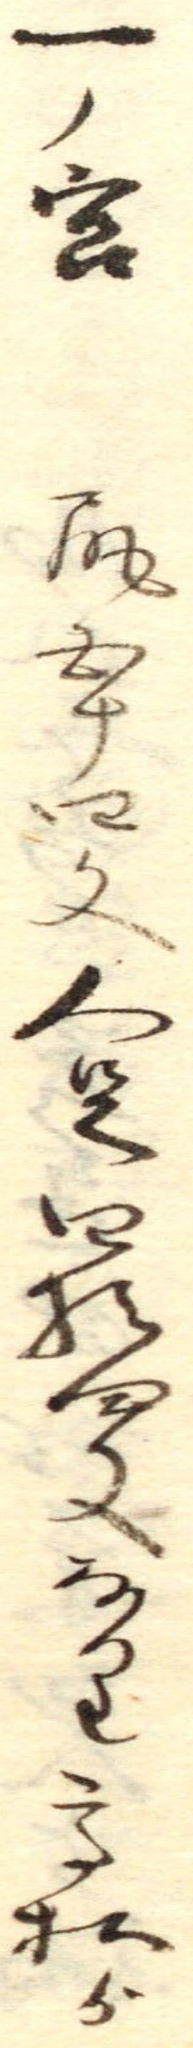一ノ宮尻五十四文人足四拾四文なり高松ゟ
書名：能登名跡誌
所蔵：Ishikawa Prefectural Library
